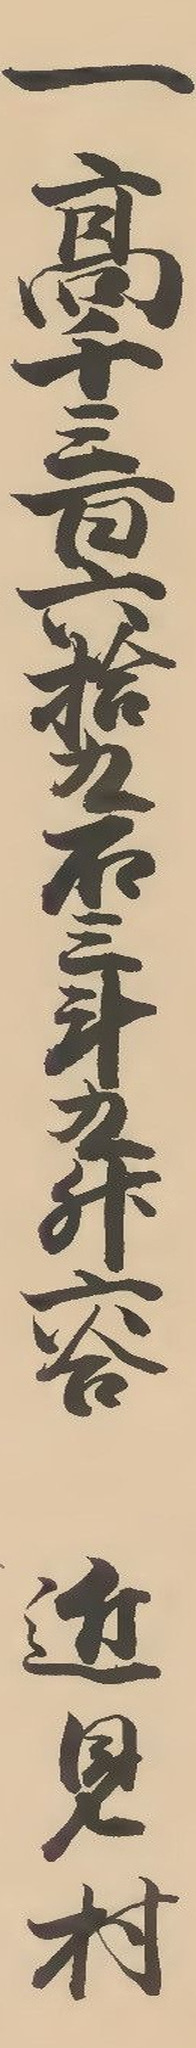一髙千三百六拾九石三斗九升六合近見村
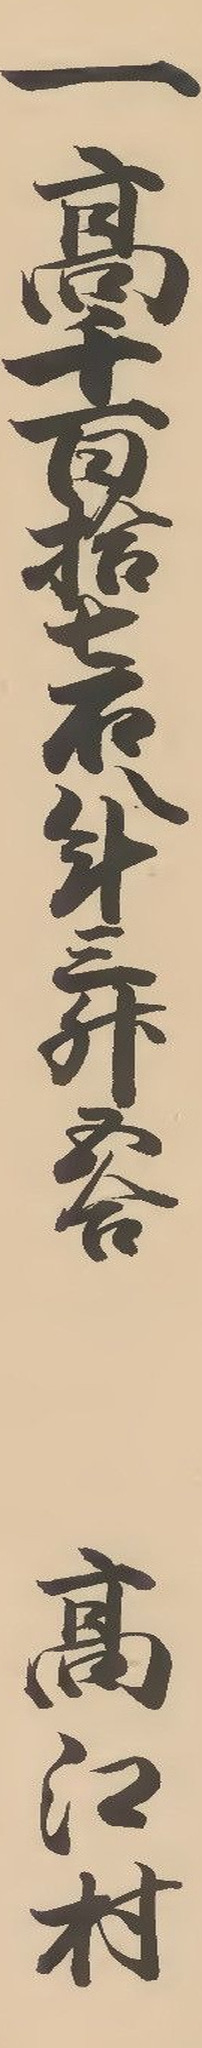一髙千百拾七石八斗三升五合髙江村
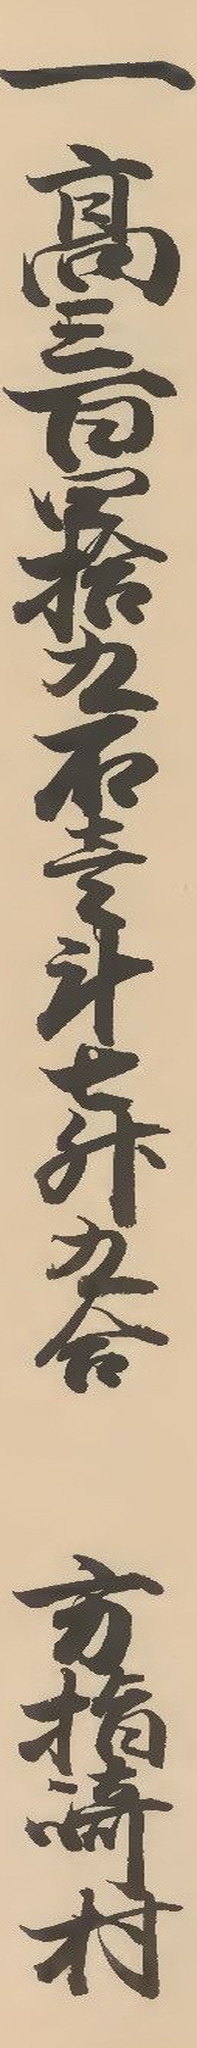一髙三百四拾九石壱斗七升九合方指崎村
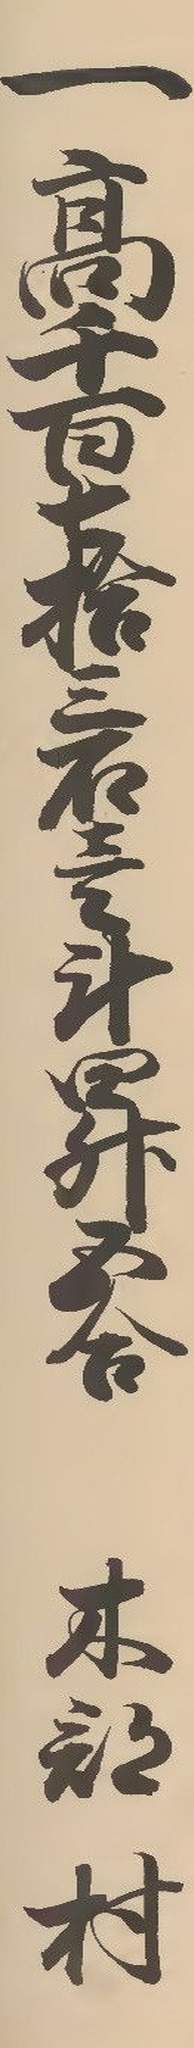一髙千百七拾三石壱斗四升五合本部村
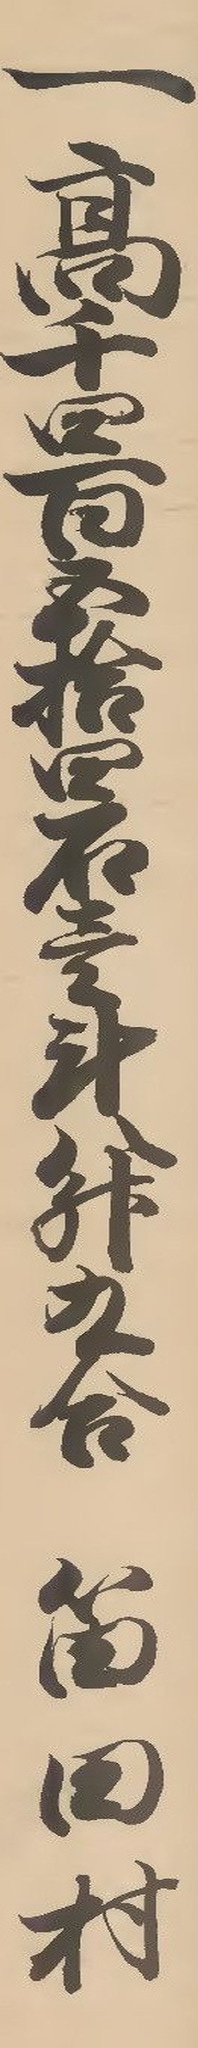一髙千四百五拾四石壱斗八升九合笛田村
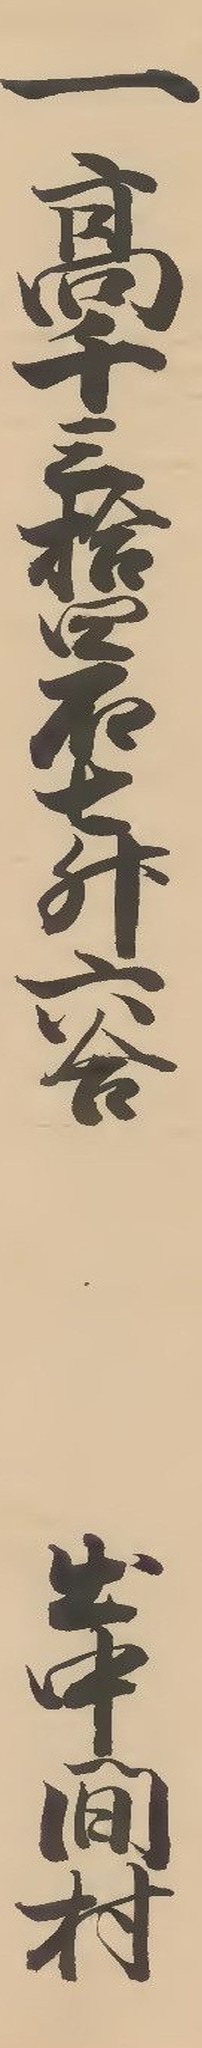一髙千三拾四石七升六合出中間村
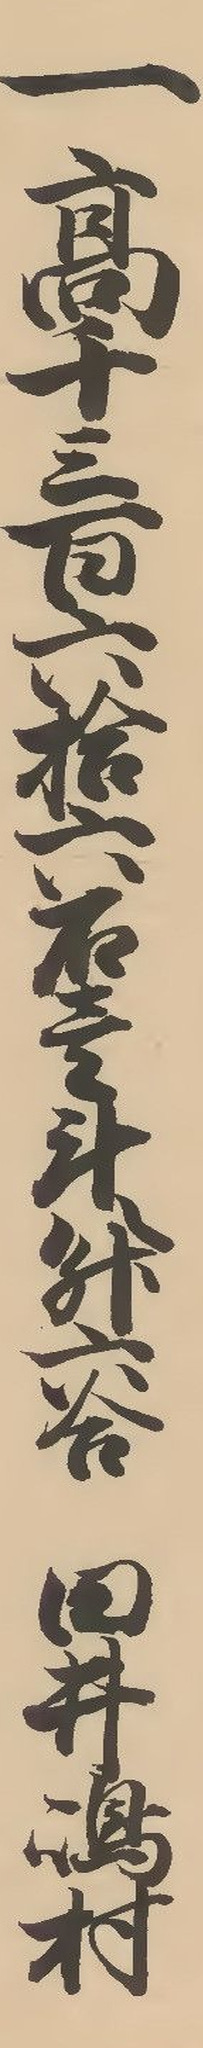一髙千三百六拾六石壱斗八升六合田井嶋村
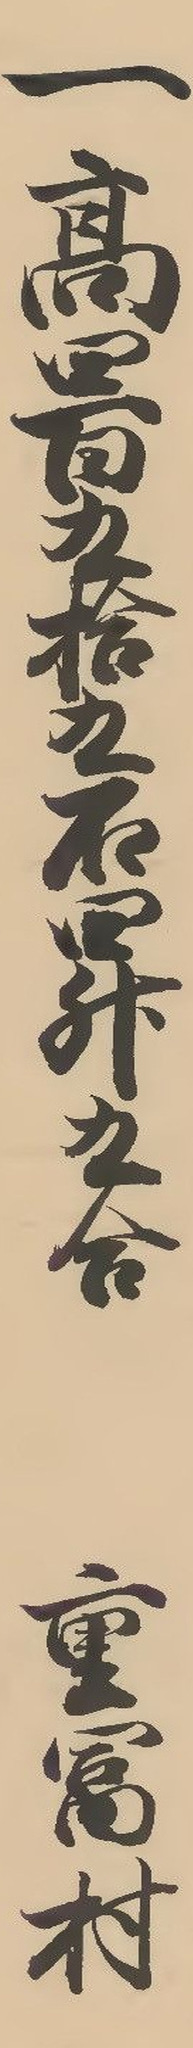一髙四百九拾九石四斗九合重冨村

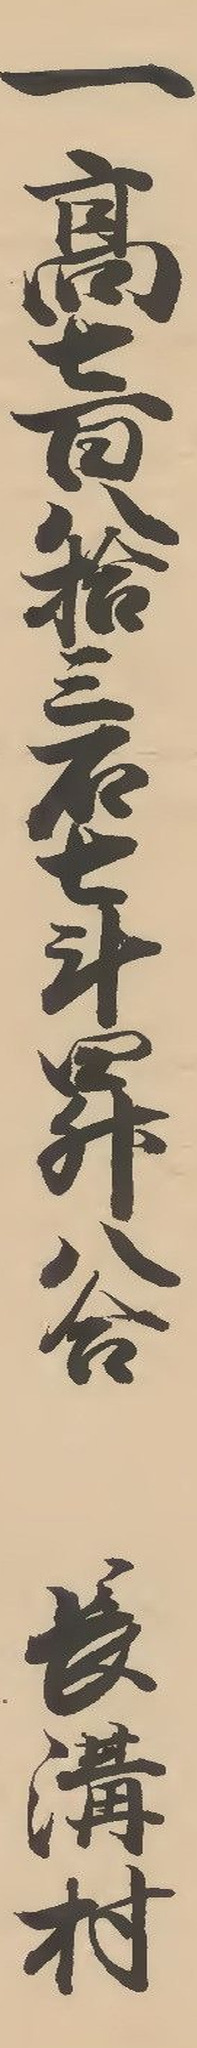一髙七百八拾三石七斗四升八合長溝村
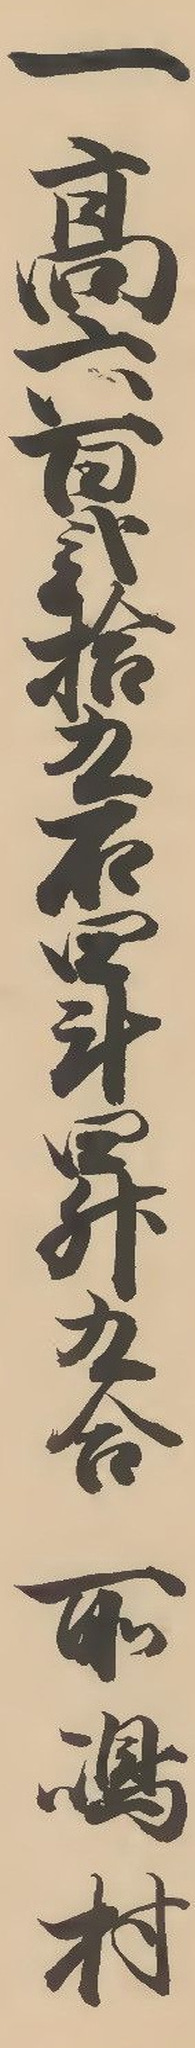一髙六百弐拾九石四斗四升九合所嶋村
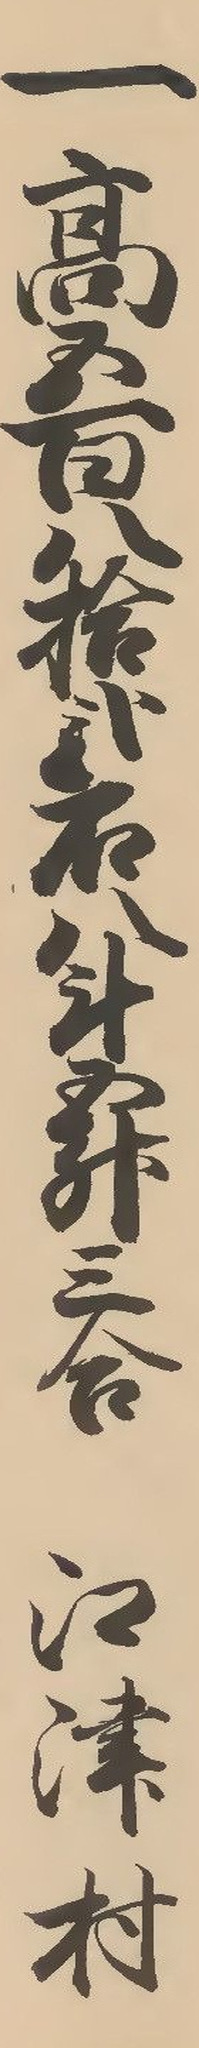一髙五百八拾弐石八斗五升三合江津村
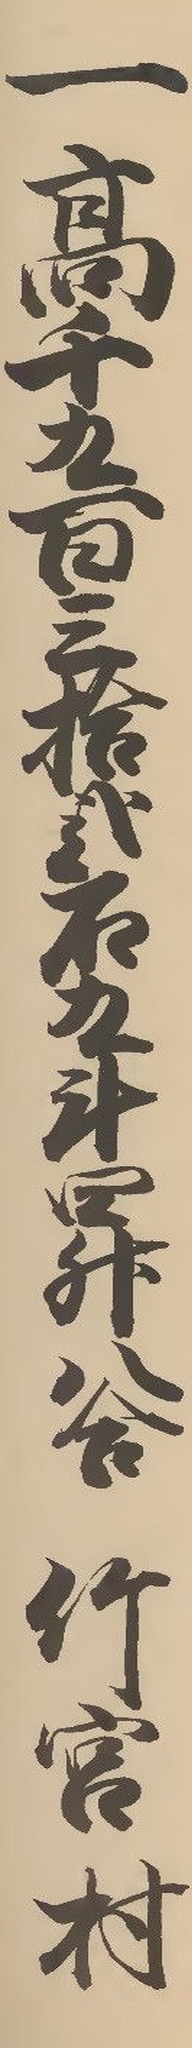一髙千九百三拾弐石九斗四升八合竹宮村
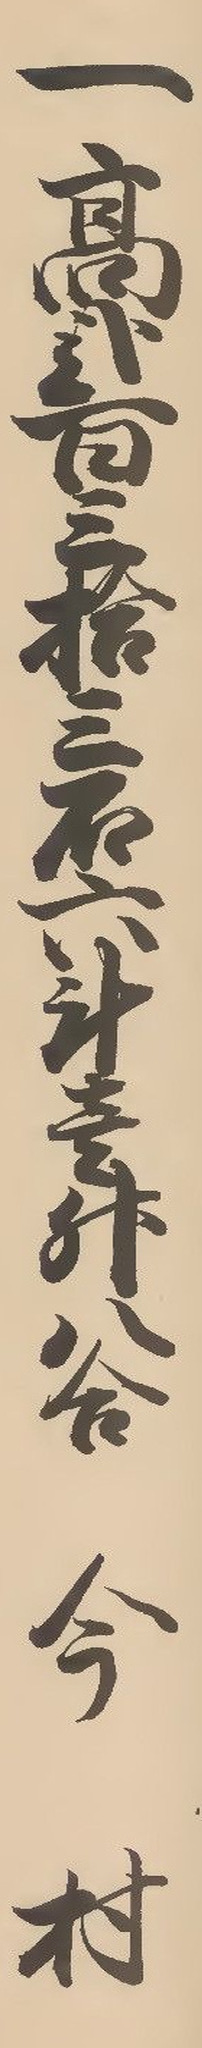一髙弐百三拾三石六斗壱升八合今村
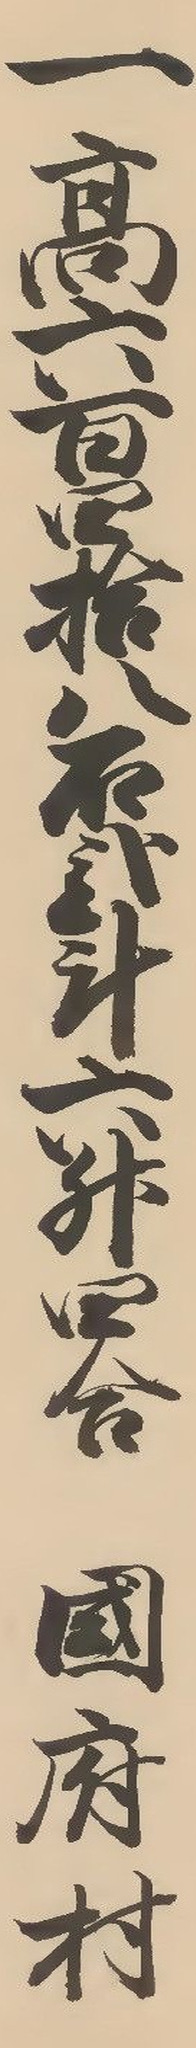一髙六百四拾八石弐斗六升四合國府村
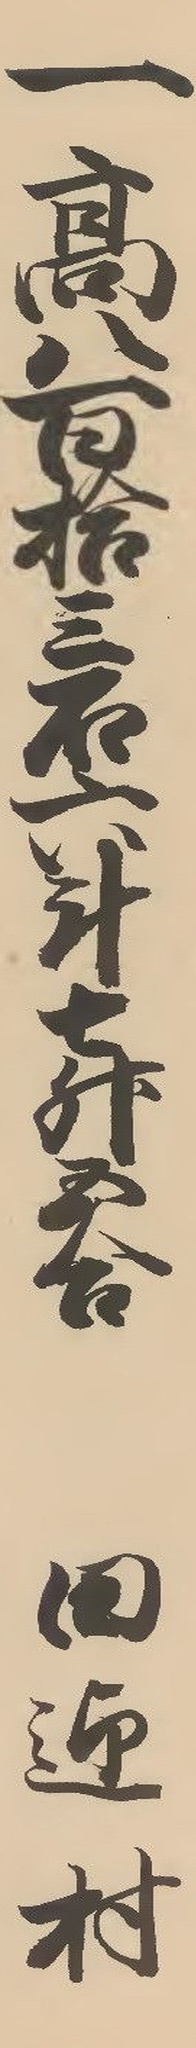一髙八百拾三石六斗七升五合田迎村
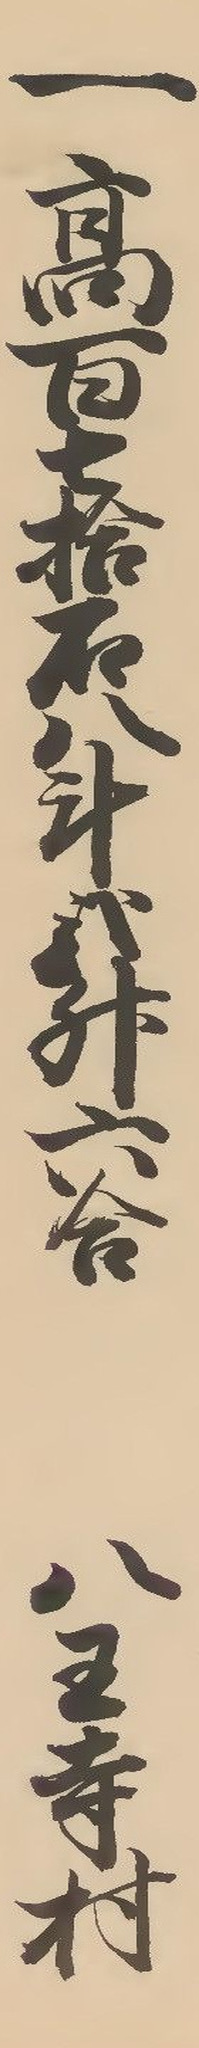一髙百七拾石八斗弐升六合八王子村
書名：肥後国郷帳
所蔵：国立公文書館 National Archives of Japan
